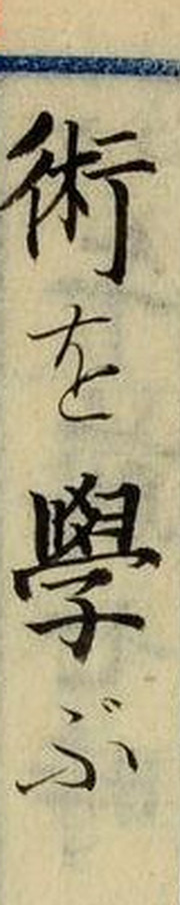術を学ぶ
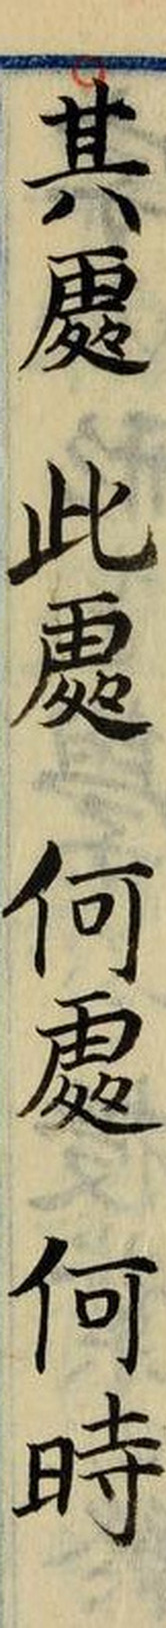其処此処何処何時
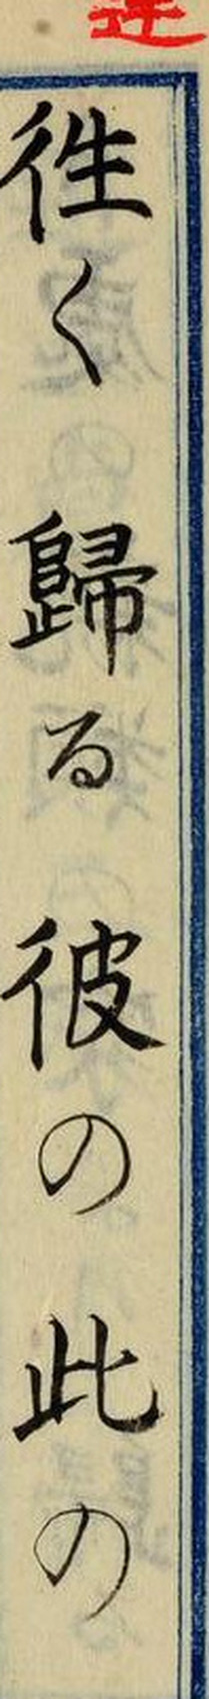往く帰る彼の此の
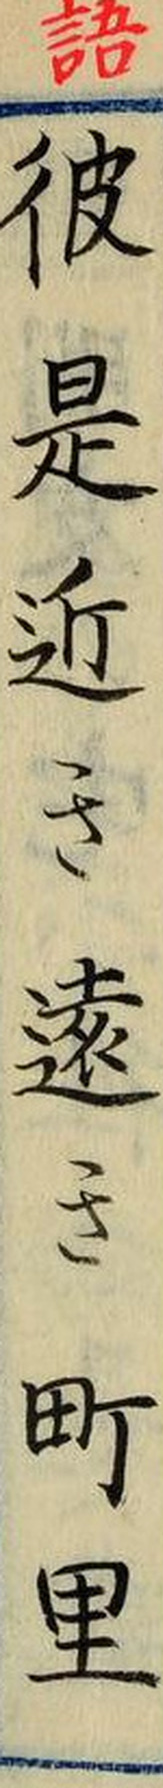彼是近き遠き町里
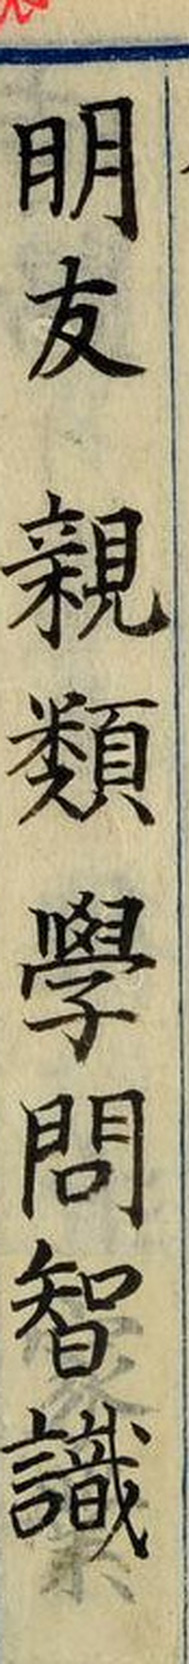朋友親類学問智識
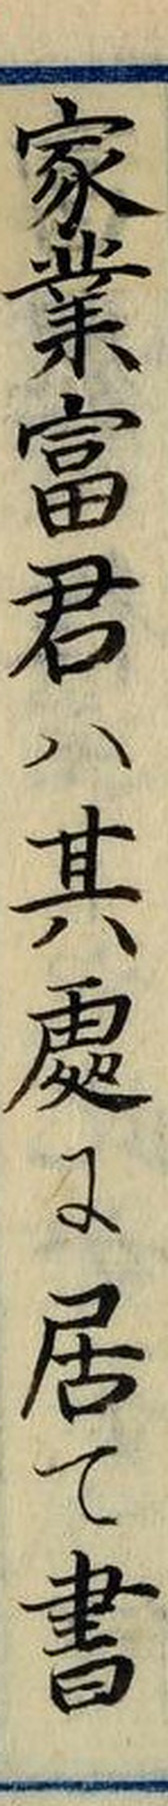家業富君ハ其処に居て書
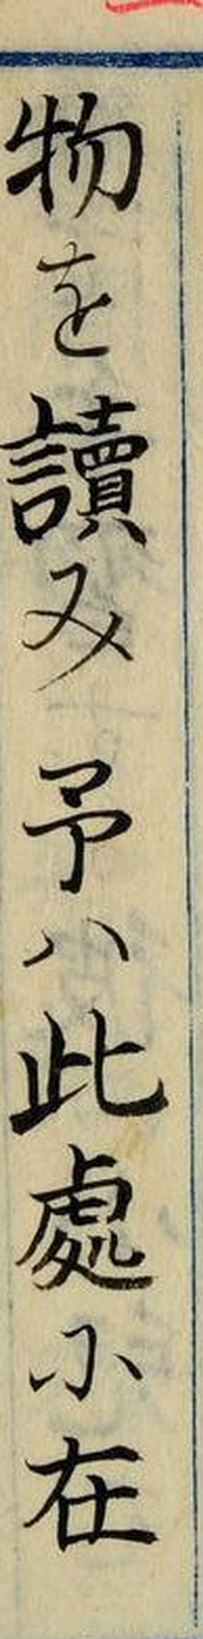物を読み予ハ此処に在

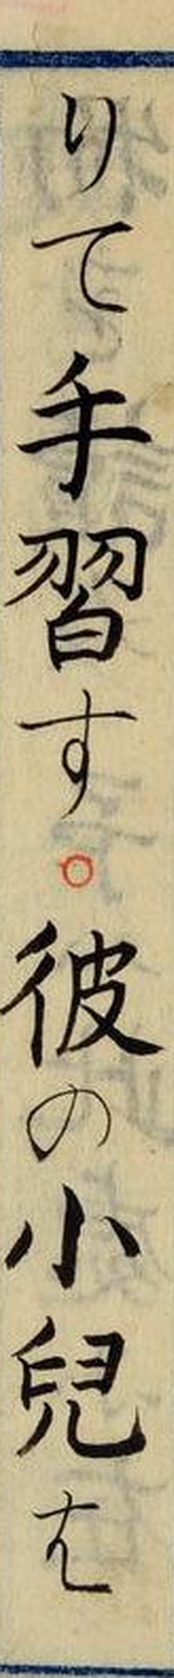りて手習す〇彼の小児は
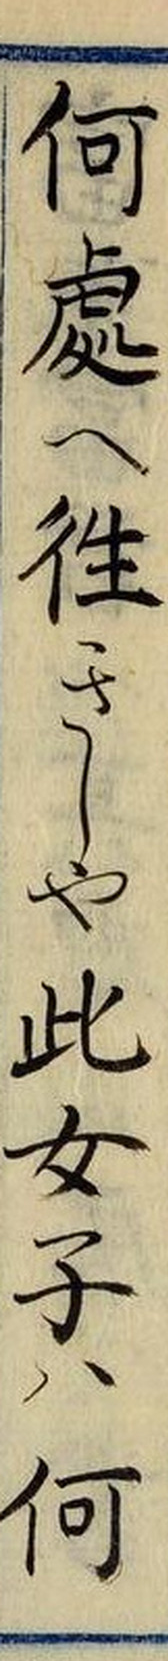何処へ往きしや此女子、何
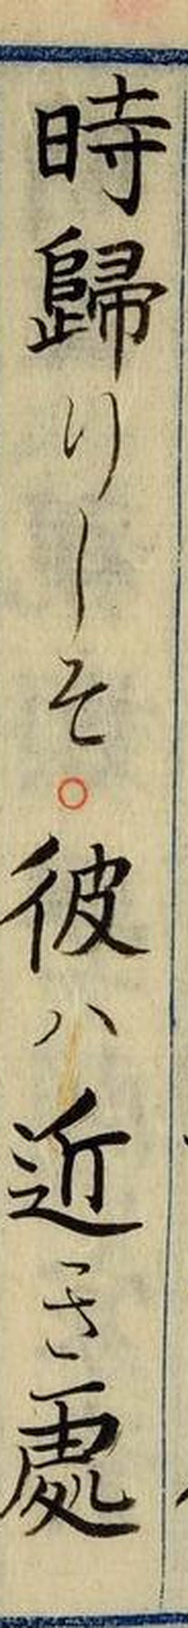時帰りしそ〇彼ハ近き処
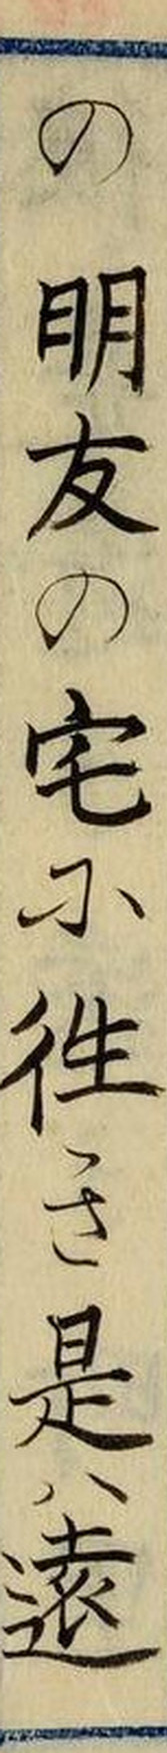の朋友の宅に往き是ハ遠
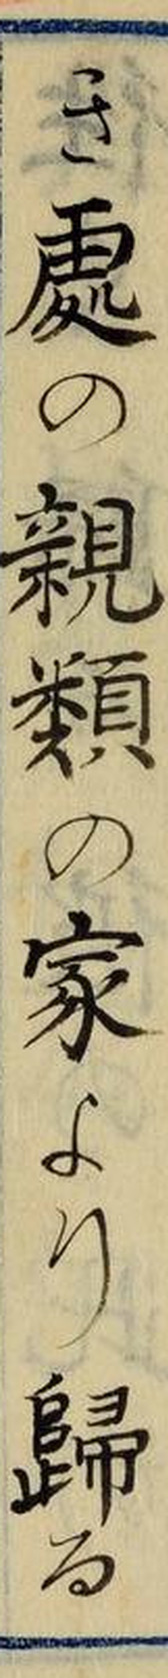き処の親類の家より帰る
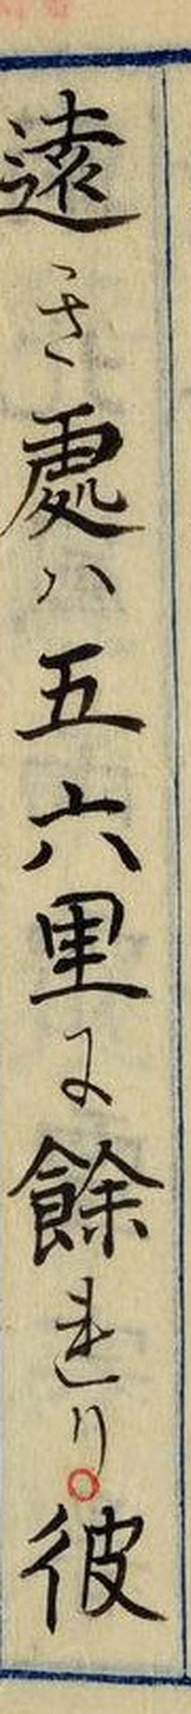遠き処ハ五六里に餘連り〇彼
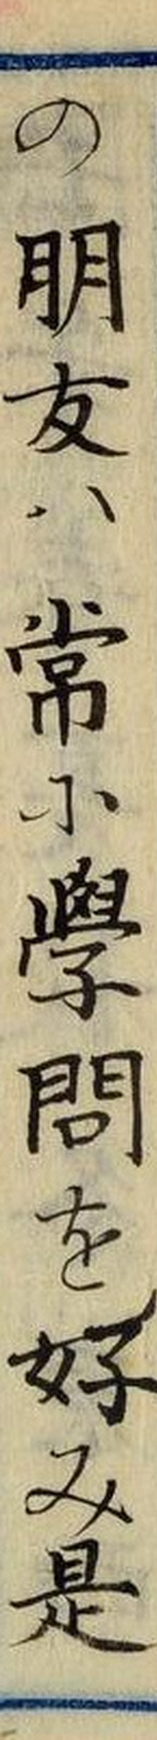の朋友ハ常に学問を好み是
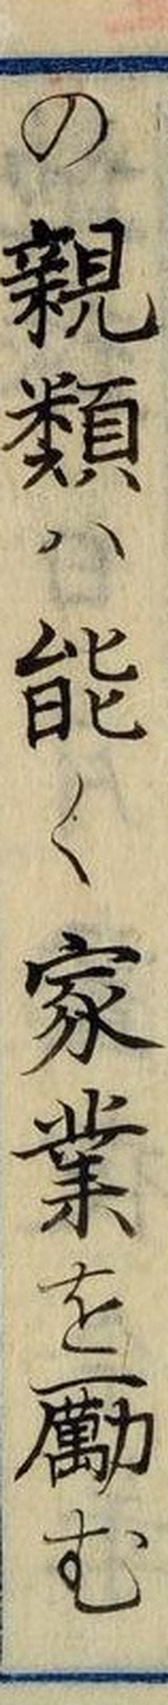の親類ハ能く家業を励む
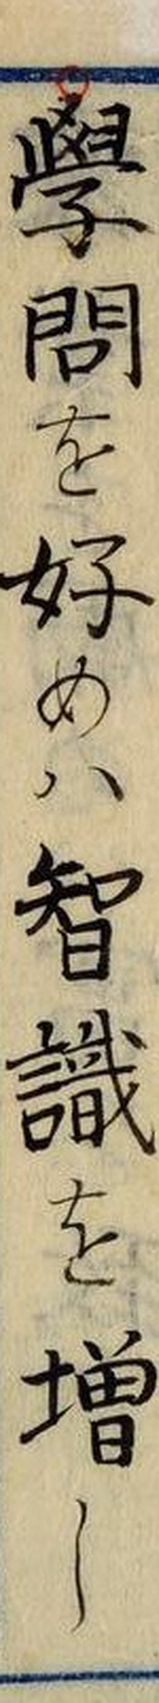学問を好めハ智識を増し
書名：村名・連語
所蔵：福井県文書館 Fukui Prefectural Archives
